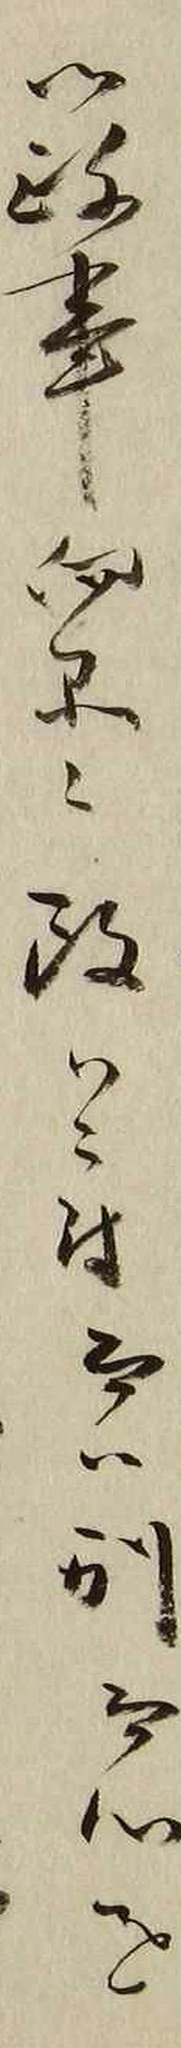御政事向品々改候に付而は別而心を
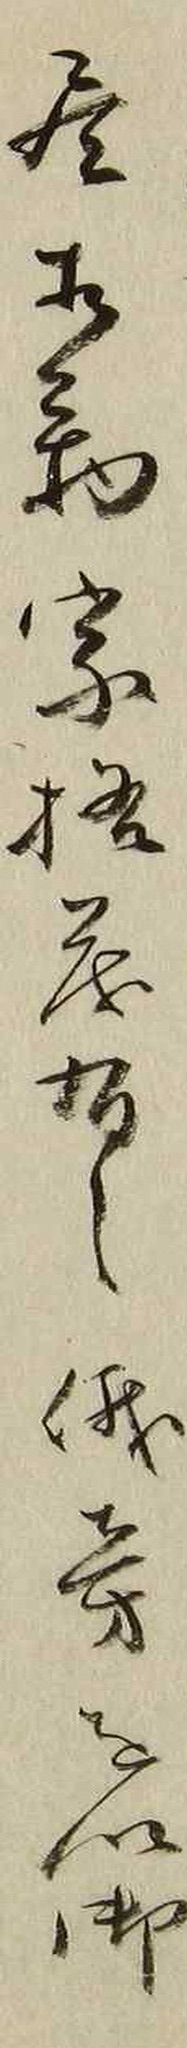尽相勤家格も有之儀旁を以御
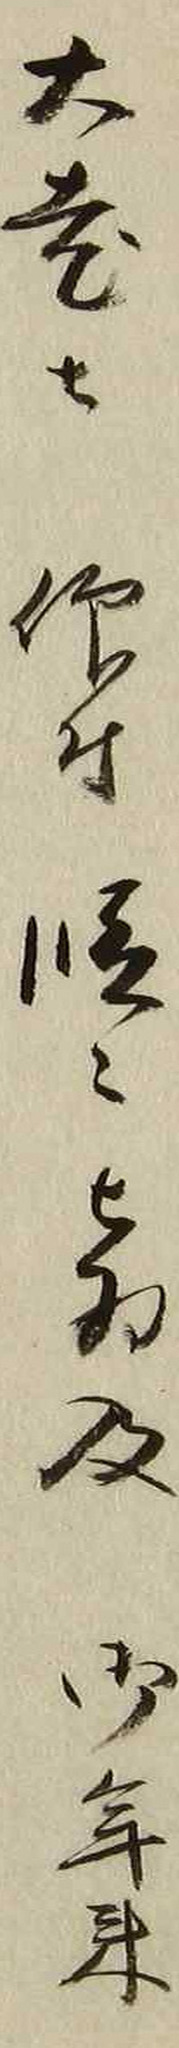大老被仰付段々被為及御年來
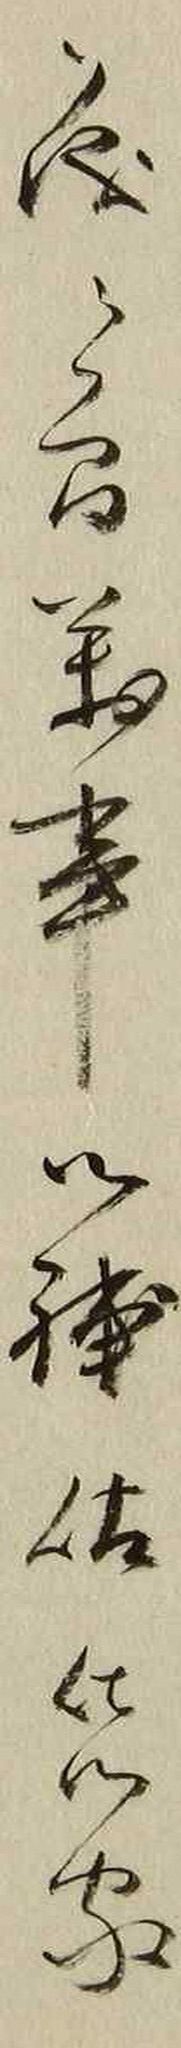候儀に候間万事御補佐仕御家
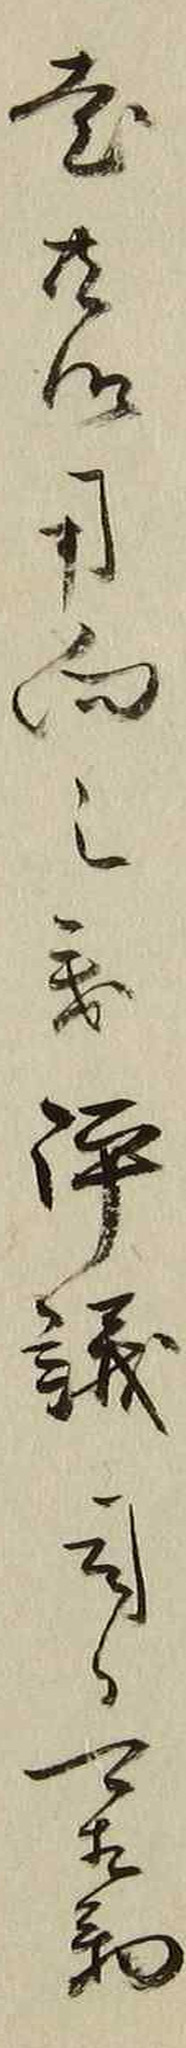老共御用向之義評議司り可相勤
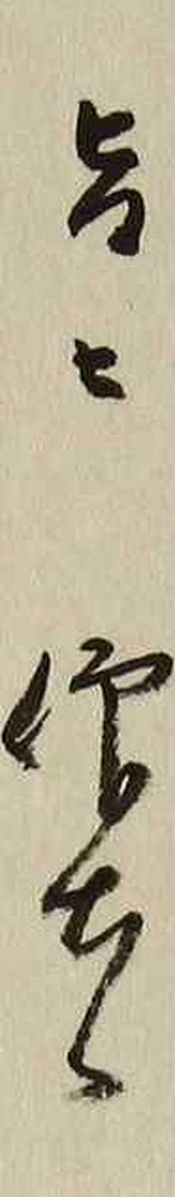旨被仰出候
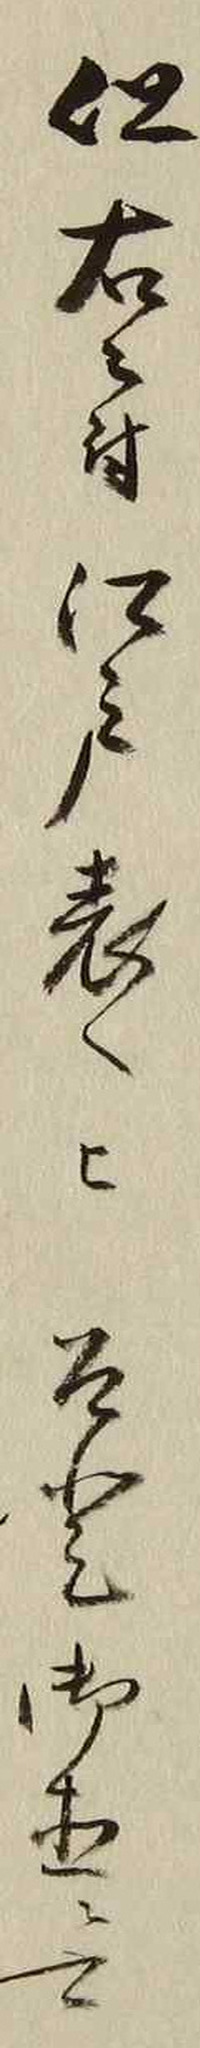但右に付江戸表へ被召登御直に
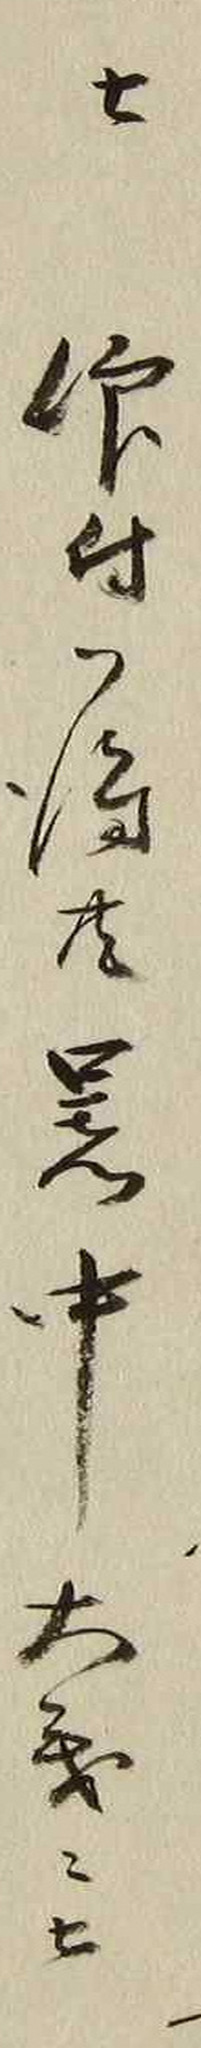被仰付候得共暑中大義に被
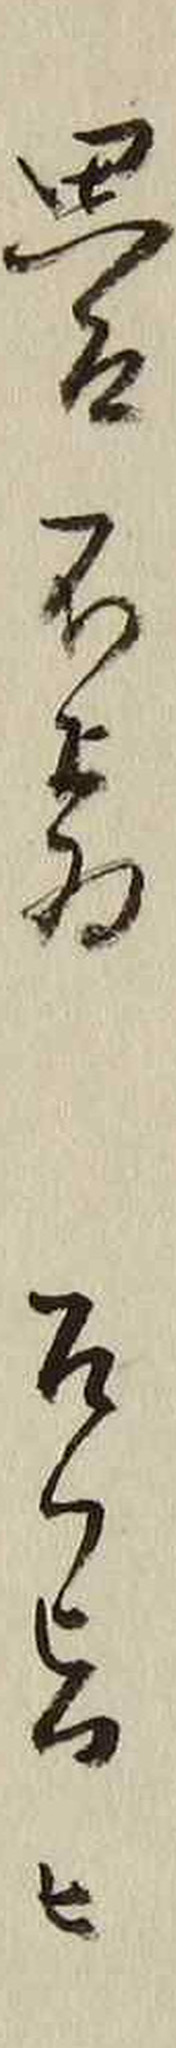思召不被為召候旨被
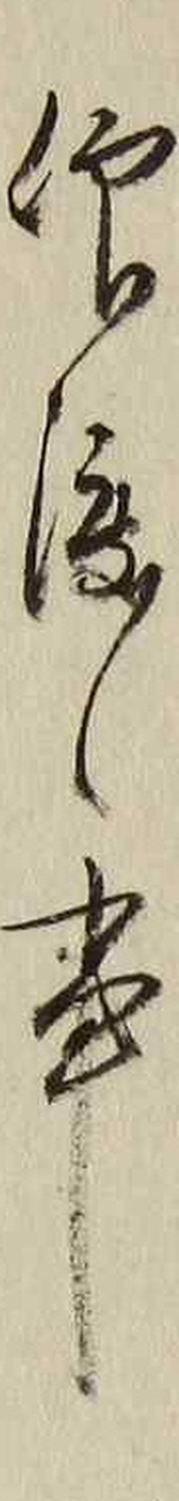仰渡候事
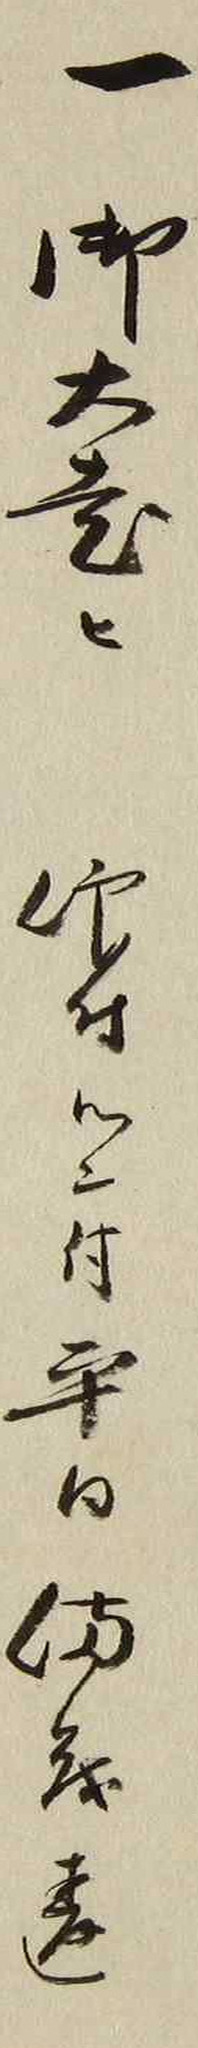一御大老被仰付候に付平日備も違
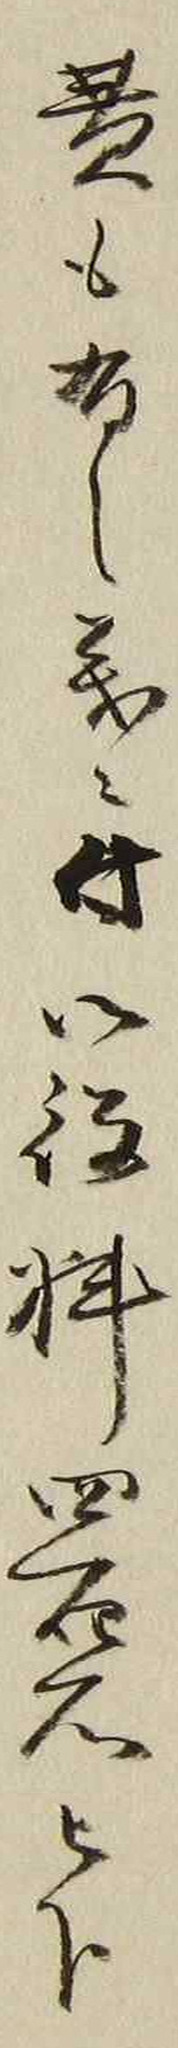費も有之義に付御役料四百石被下
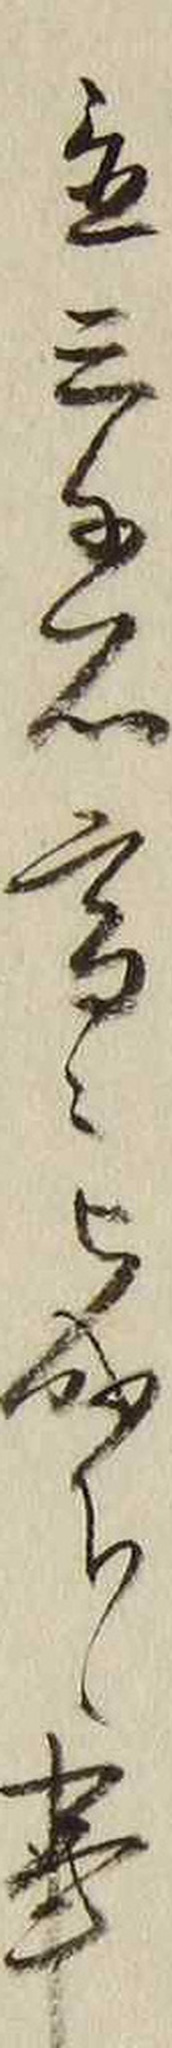置三千石高に被成下候事
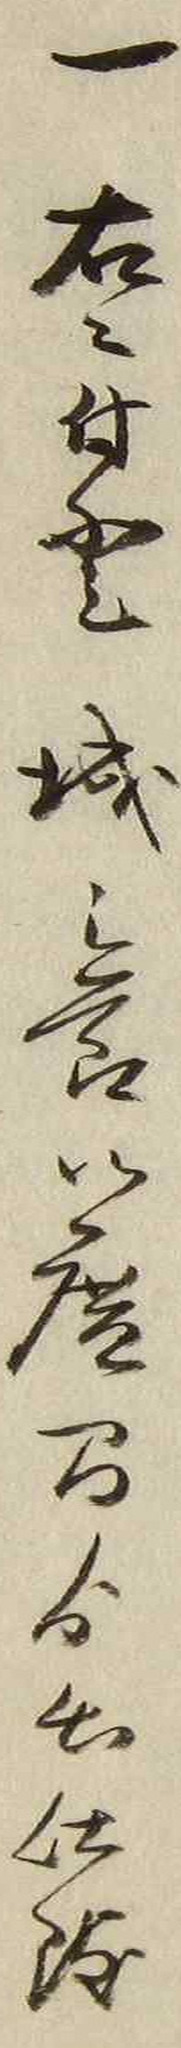一右に付登城之節御広間ゟ出仕致
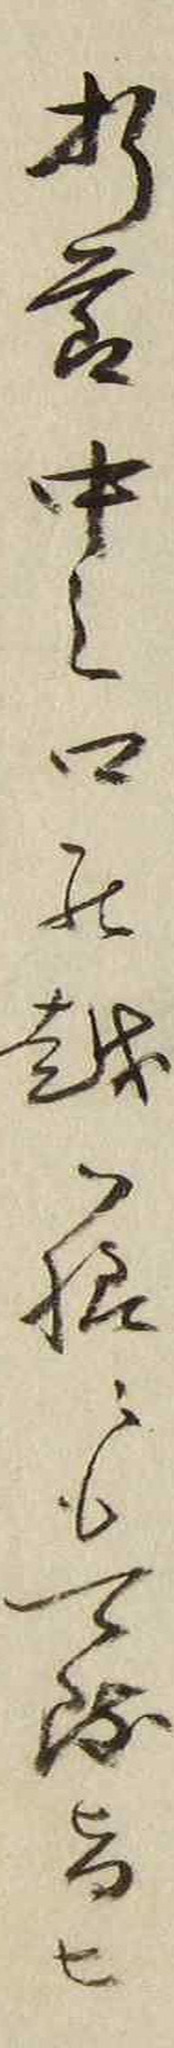折節中之口罷越候様にも可致旨被

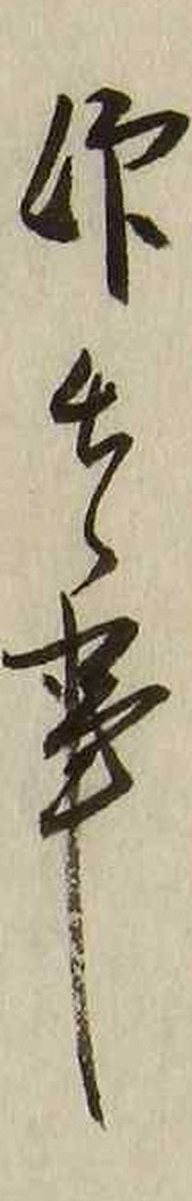仰出候事
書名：諸士系譜　巻之292　き之部1
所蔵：会津若松市立会津図書館
